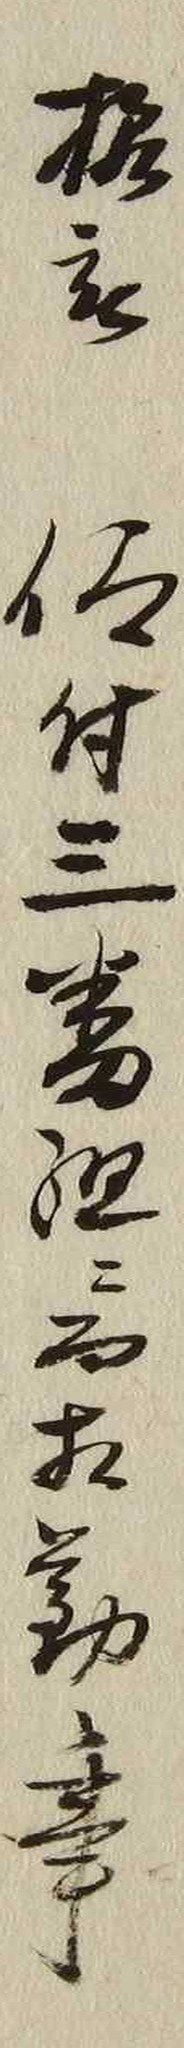様被仰付三番組ニ而相勤候事
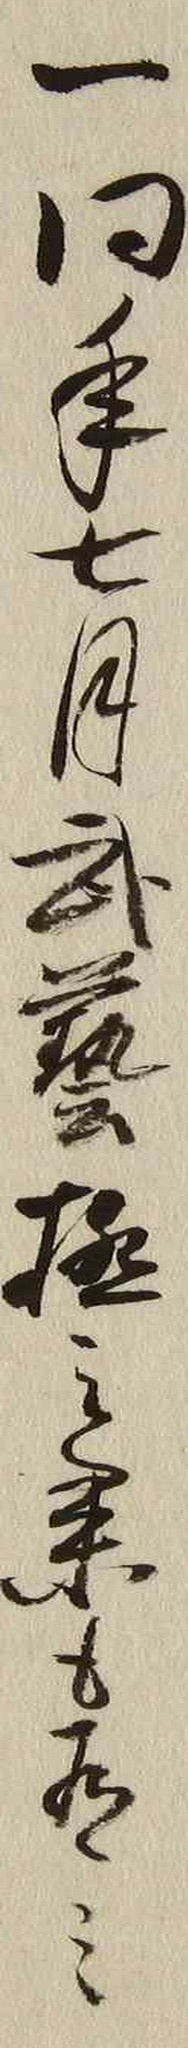一同年七月武芸極之業も有之
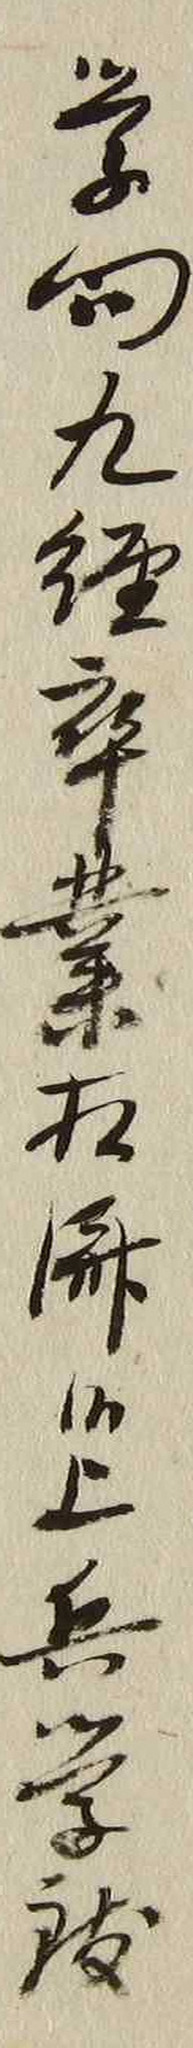学問九経卒業相済候上兵学致
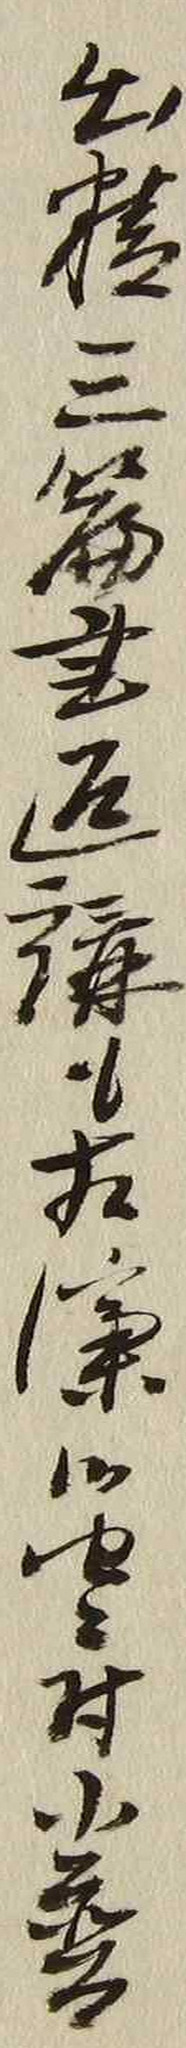出精三篇書返講も相済候由ニ付小普
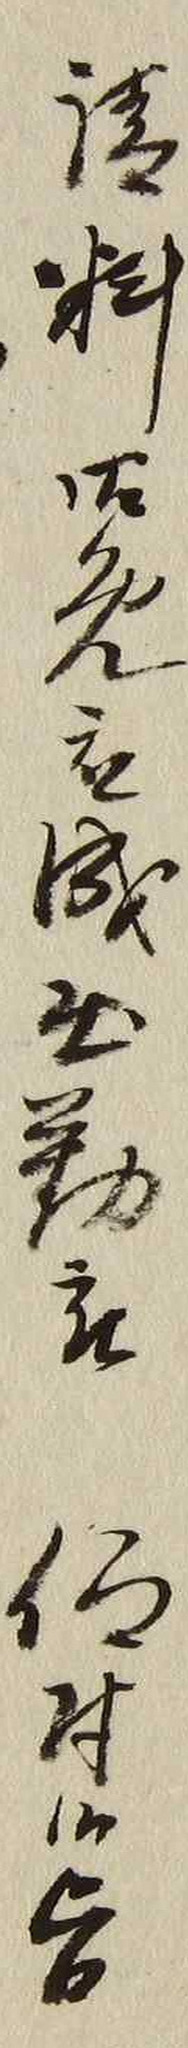請料御免被成出勤被仰付候旨
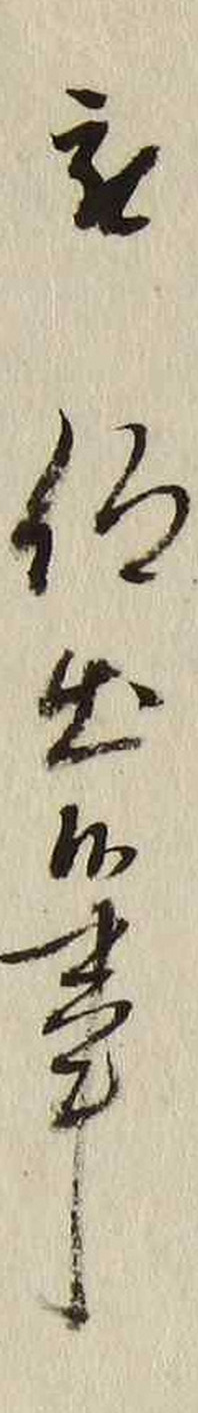被仰出候事
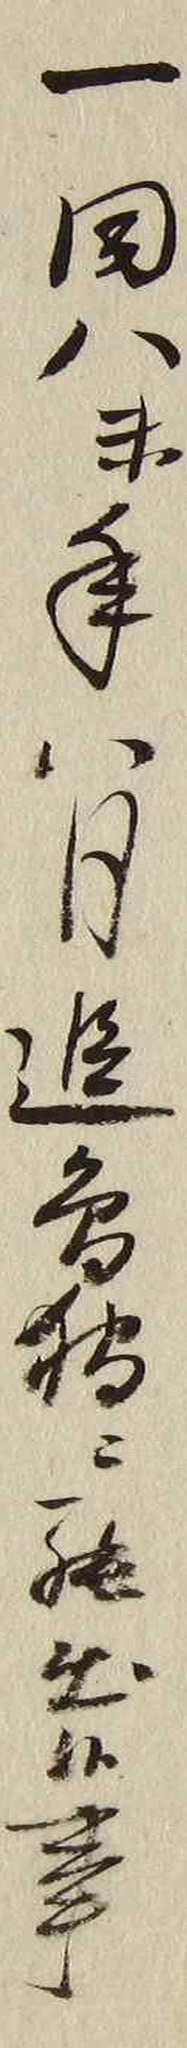一同八未年八月追鳥狩ニ罷出候事
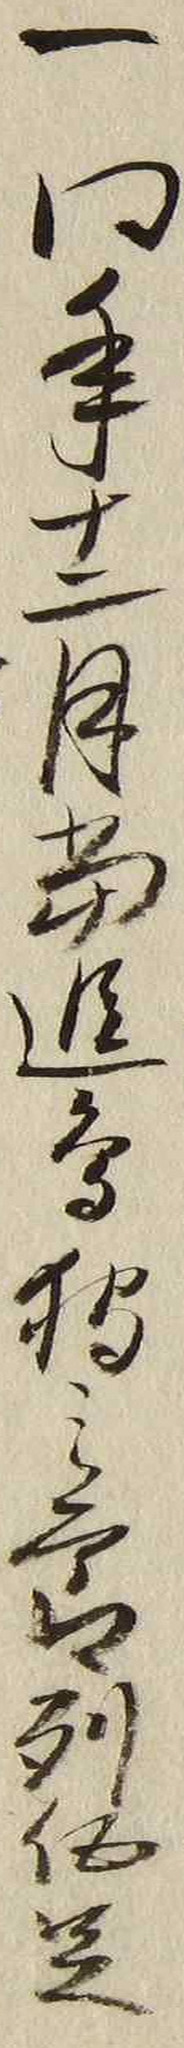一同年十二月当追鳥狩之節列伍足
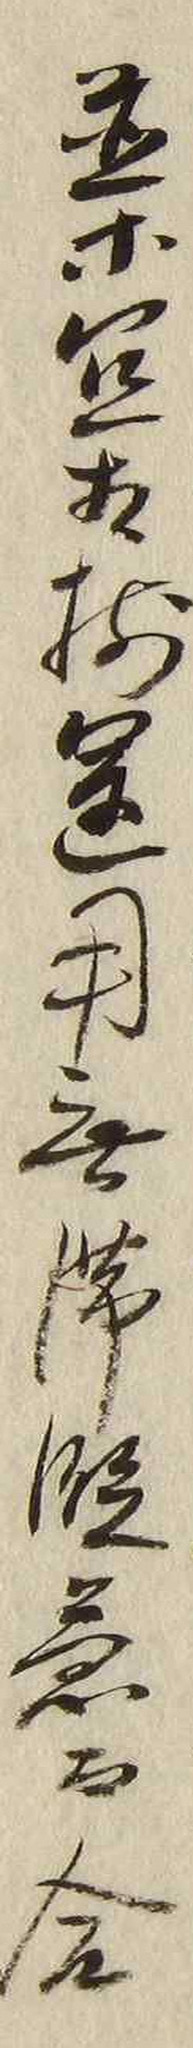並等宜相揃運用無滞段兼而合

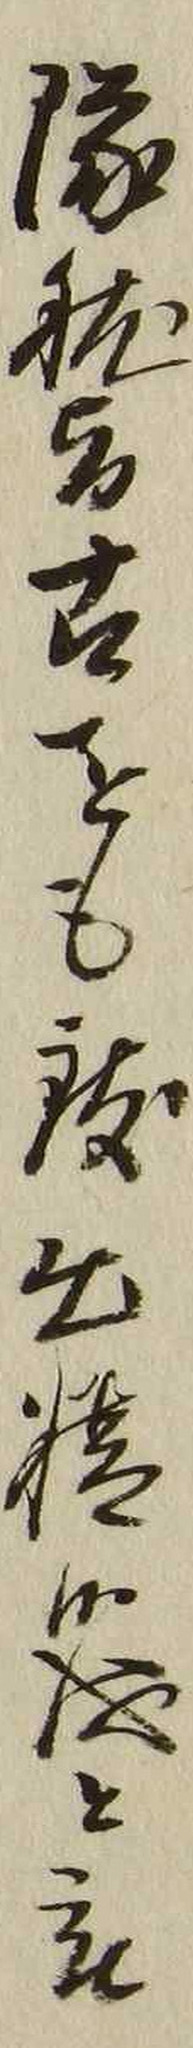隊稽古をも致出精候儀と被
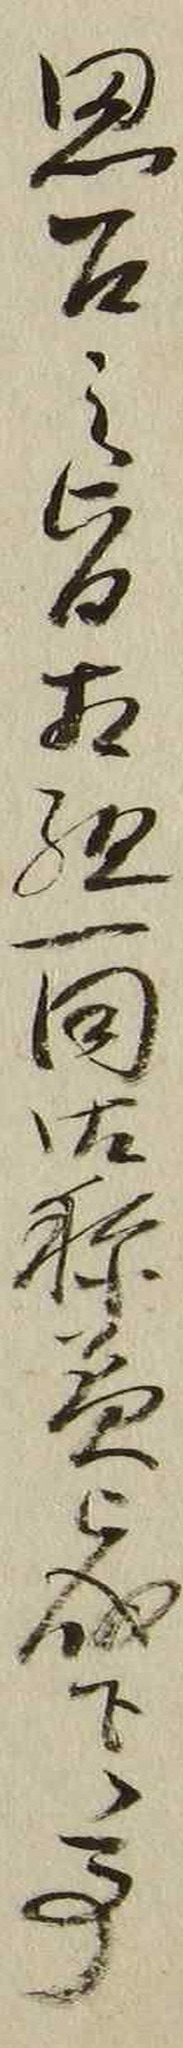思召之旨相組一同御称美被成下候事
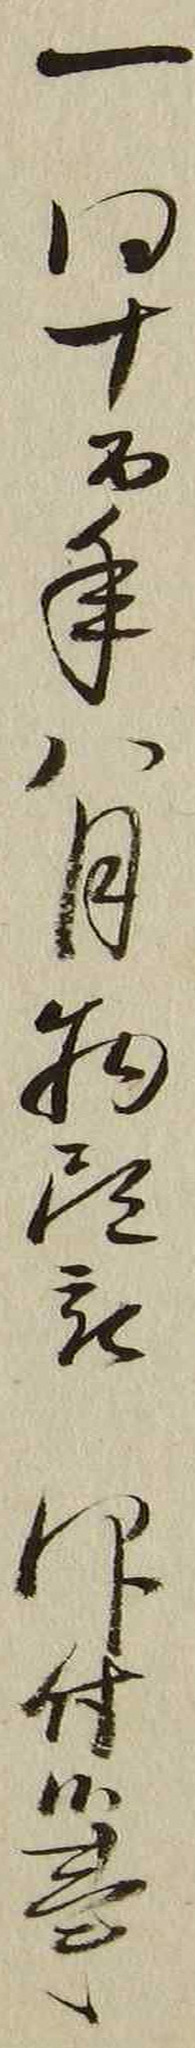一同十酉年八月物頭被仰付候事
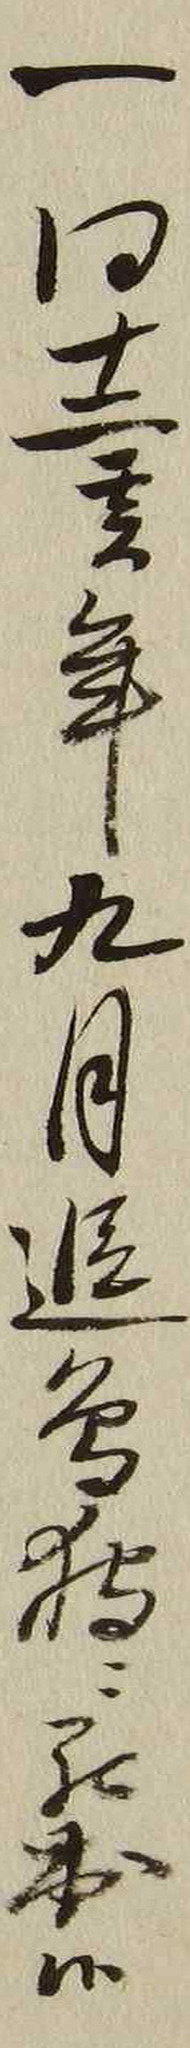一同十二亥年九月追鳥狩ニ罷出候
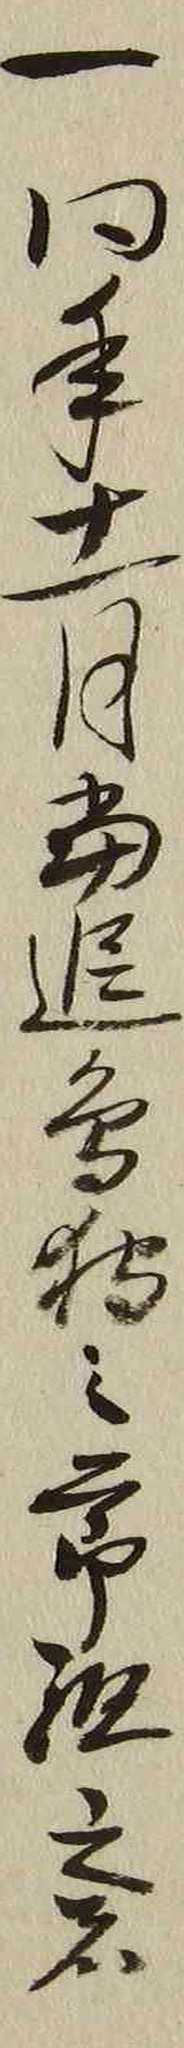一同年十一月当追鳥狩之節組之者
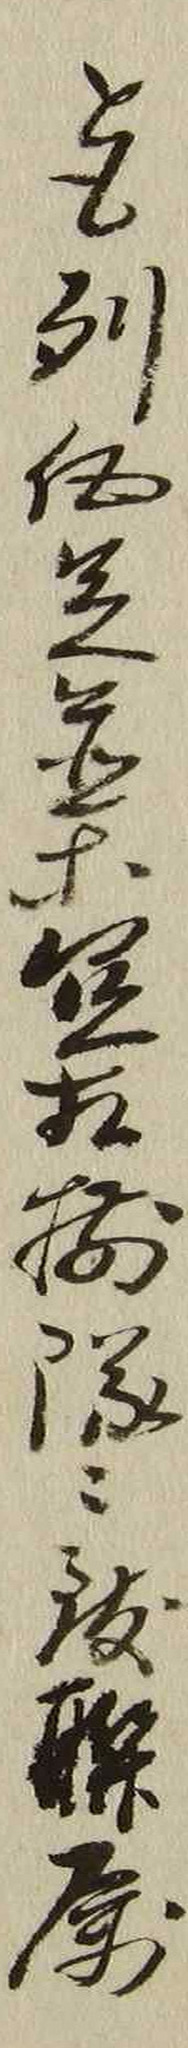とも列伍足並等宜相揃隊々致聯属
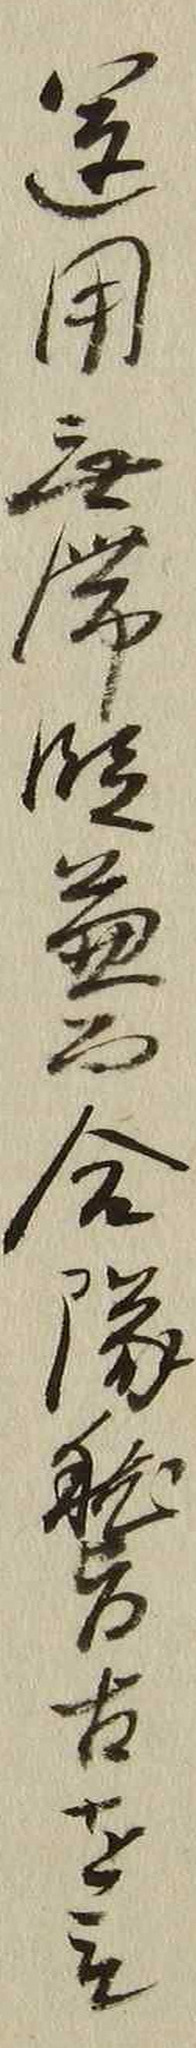運用無滞段兼而合隊稽古をも
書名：諸士系譜　巻之355　す之部5
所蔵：会津若松市立会津図書館
